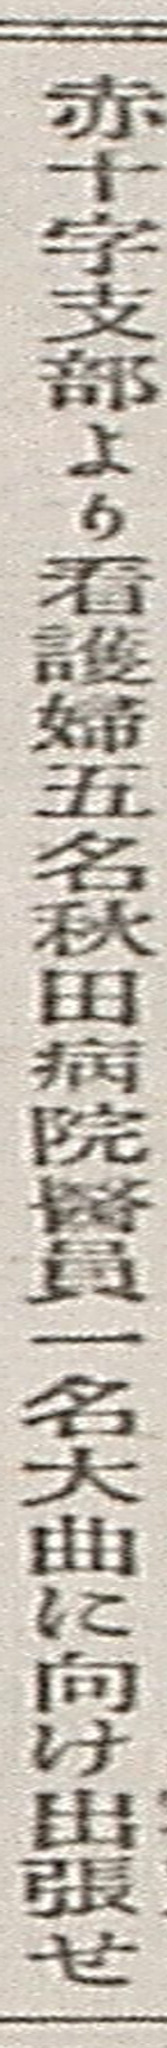赤十字支部より看護婦五名秋田病院医員一名大曲に向け出張せ
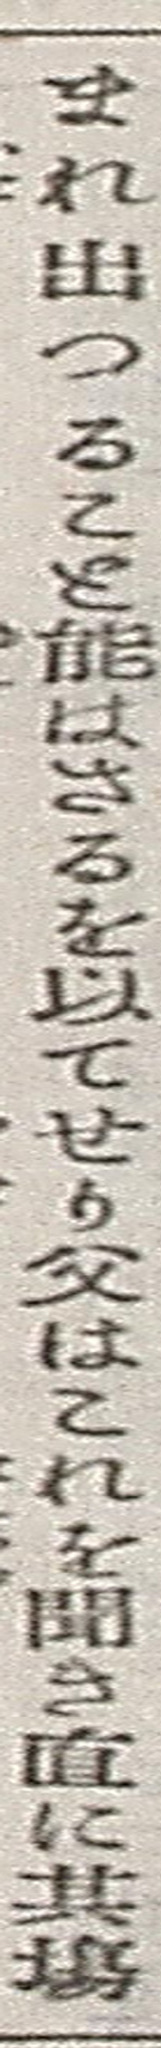まれ出つること能はさるを以てせり父はこれを聞き直に其場
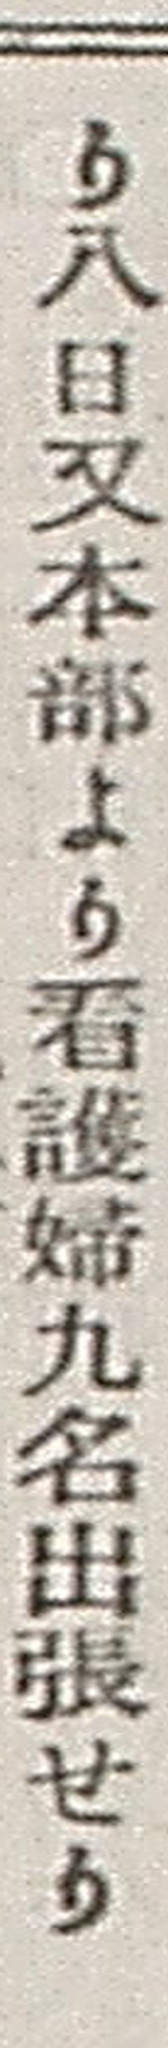り八日又本部より看護婦九名出張せり
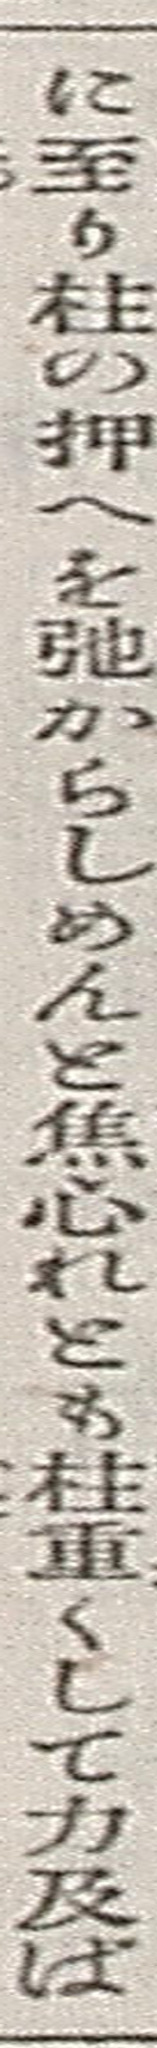に至り柱の押へを弛からしめんと焦心れとも柱重くして力及ば
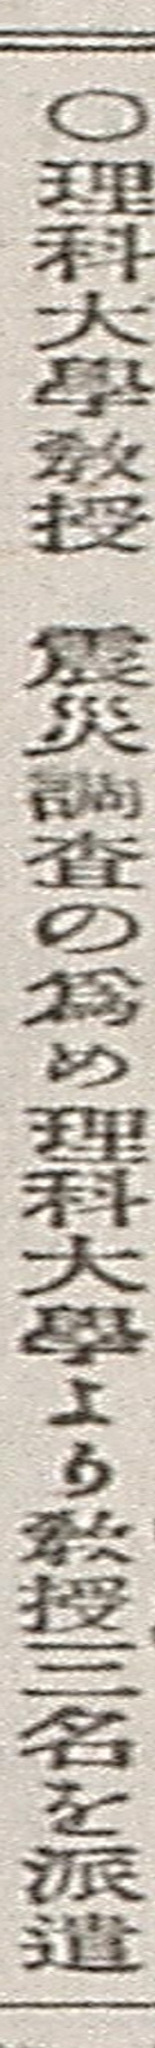〇理科大学教授震災調査の為め理科大学より教授三名を派遣
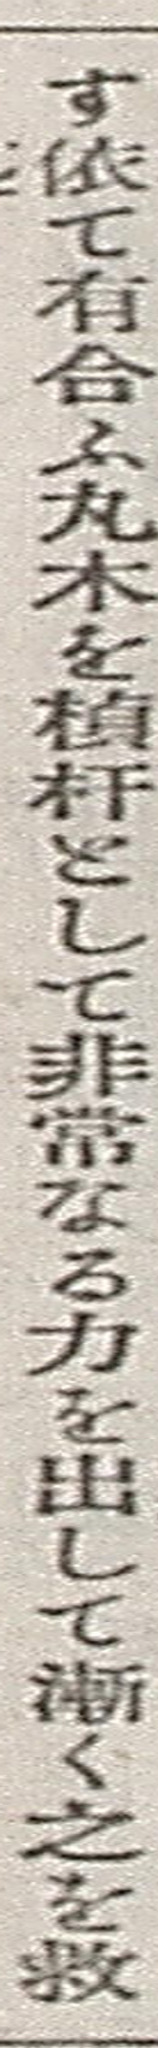す依て有合ふ丸木を槓杆として非常なる力を出して漸く之を救
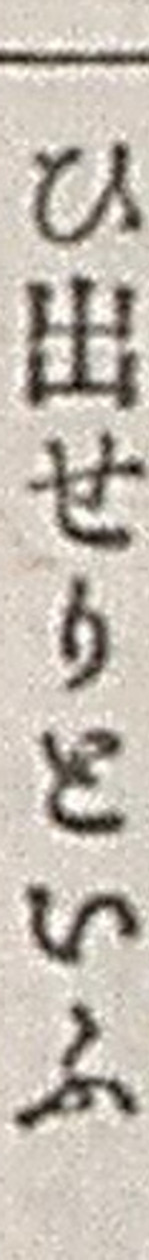ひ出せりといふ
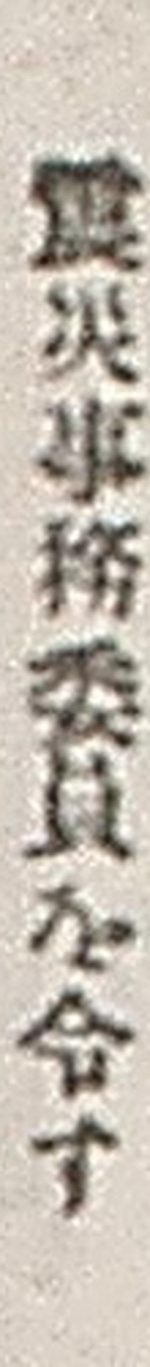震災事務委員を名す
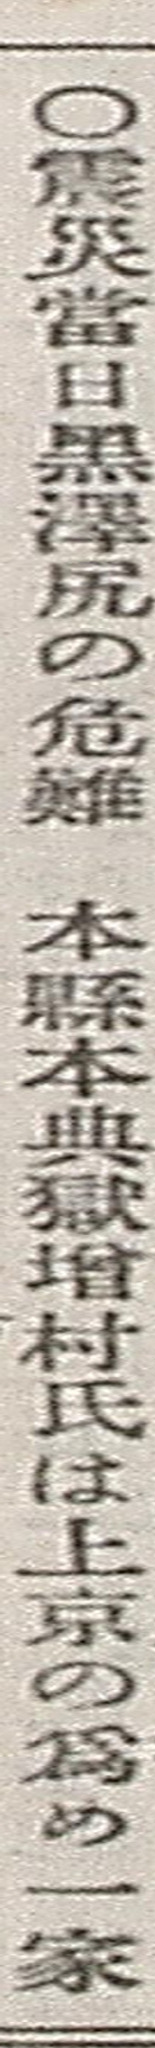〇震災当日黒沢尻の危難本県本典獄増村氏は上京の為め一家
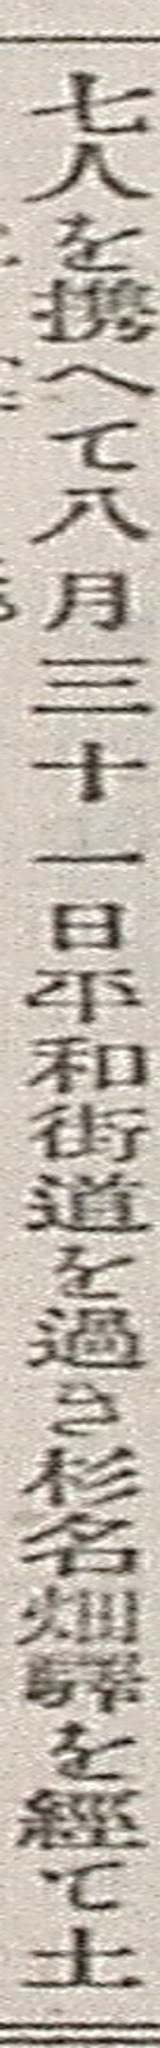七人を携へて八月三十一日平和街道を過き杉名畑駅を経て土
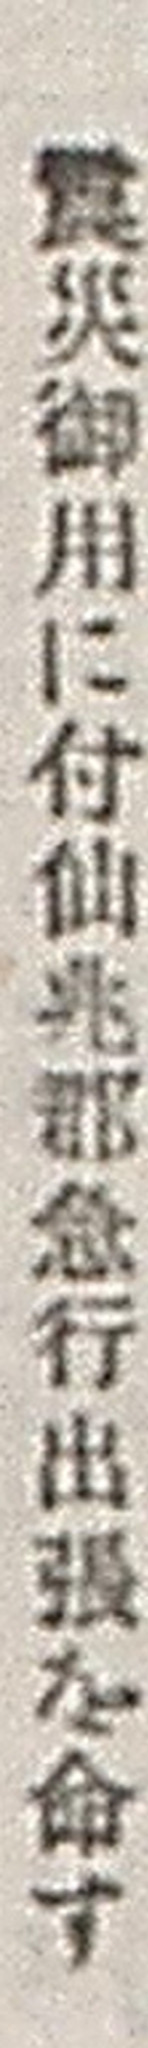震災御用に付仙北郡急行出張を命す
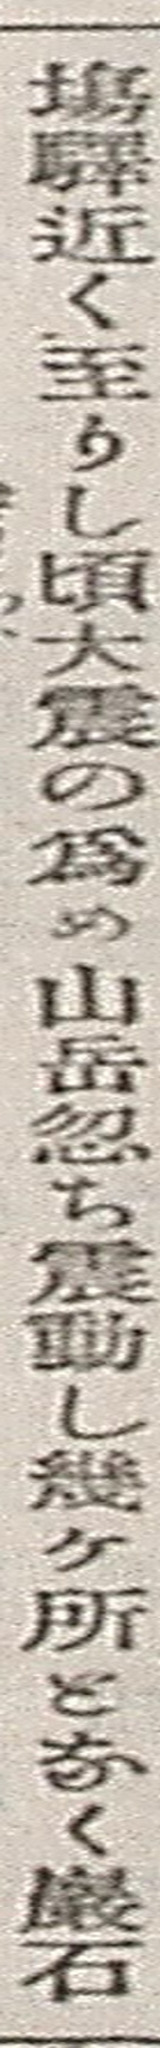場駅近く至りし頃大震の為め山岳忽ち震動し幾ケ所となく巌石
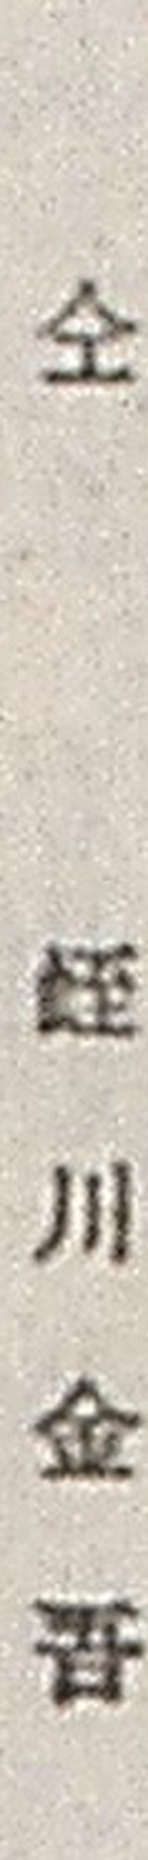仝蛭川金吾
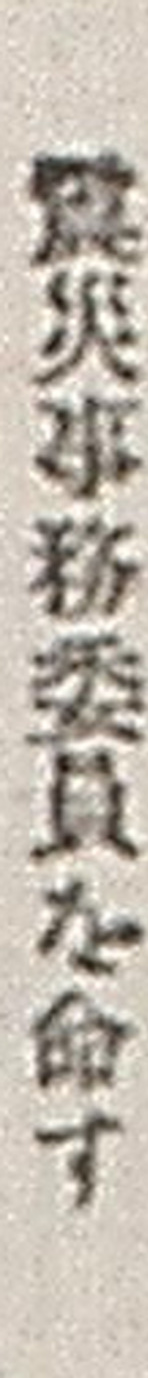震災事務委員を命す
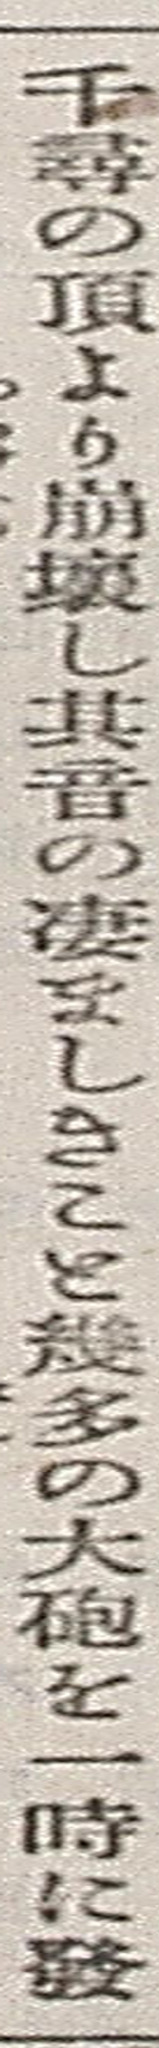千尋の頂より崩壊し其音の凄ましきこと幾多の大砲を一時に発
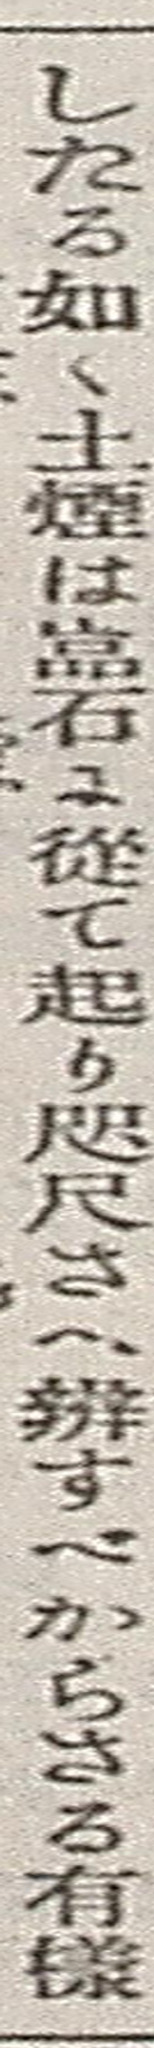したる如く土煙は嵓石に従て起り咫尺さへ弁すべからさる有様
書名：風俗畫報臨時増刊第百二十四號　洪水地震被害録（上）
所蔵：東京大学地震研究所図書室 Earthquake Research Institute Library, The University of Tokyo, JAPAN
